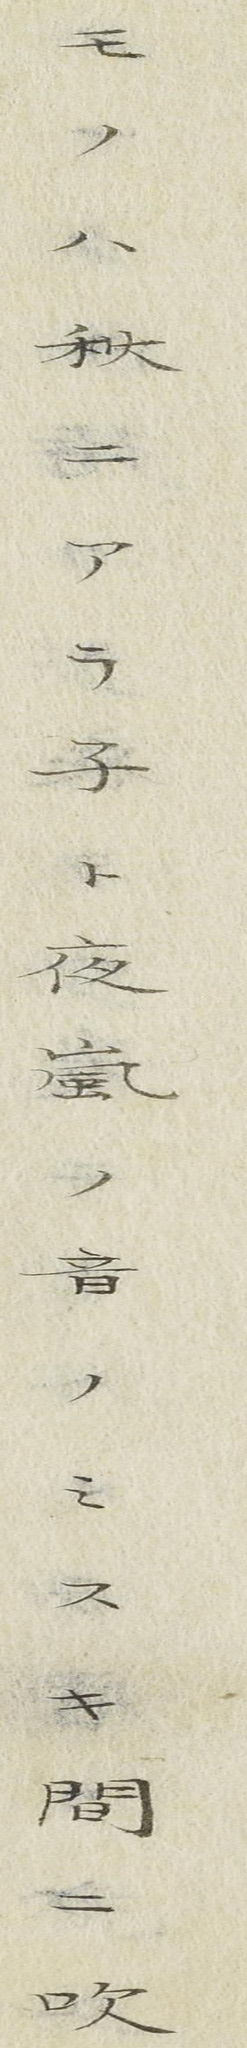モノハ秋ニアラ子ト夜嵐ノ音ノミスキ間ニ吹
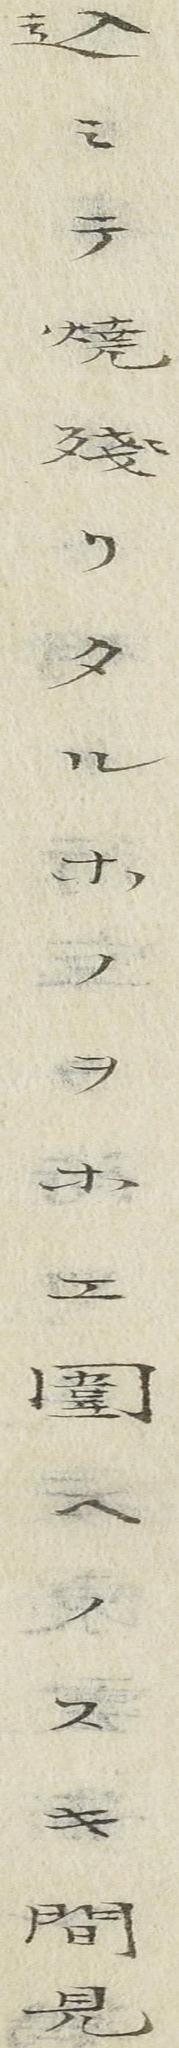込ミテ焼残リタルホノヲホエ囲ヘノスキ間見
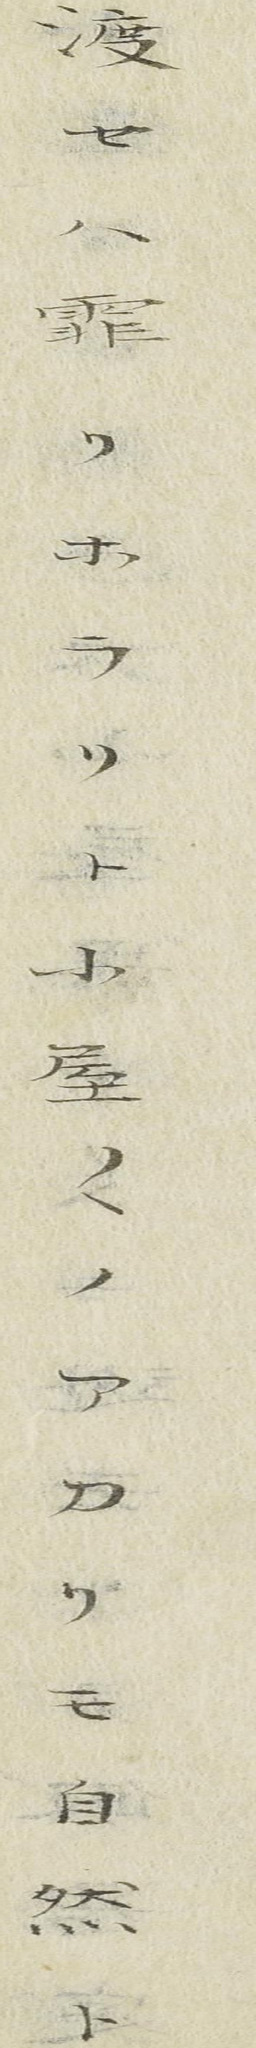渡セハ霏リホラリト小屋〱ノアカリモ自然ト
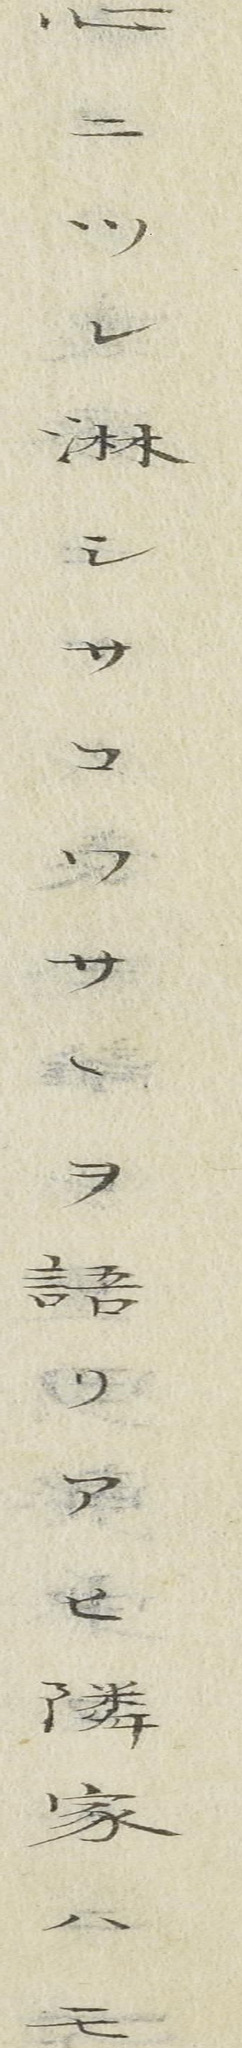心ニツレ淋シサコワサヽヲ語リアヒ隣家ハモ

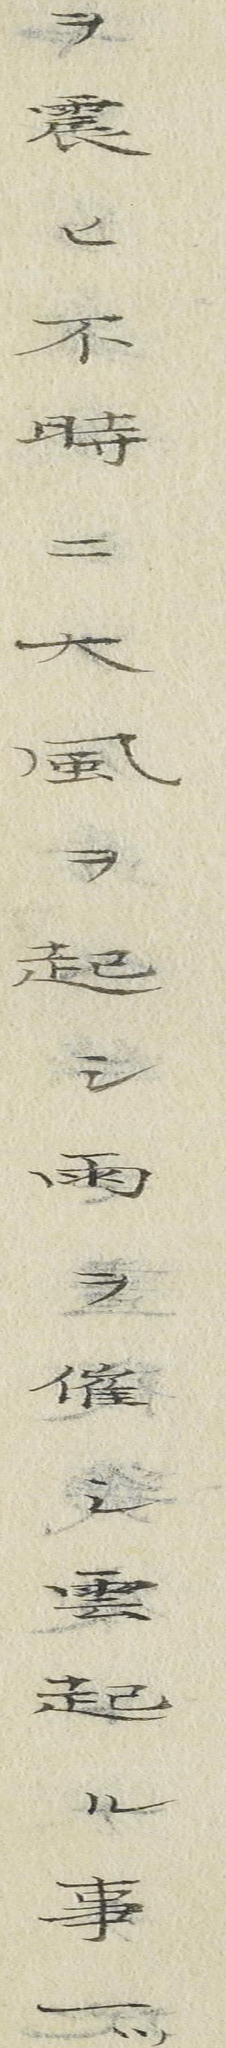ヲ震ヒ不時ニ大風ヲ起シ雨ヲ催シ曇起ル事一ツ
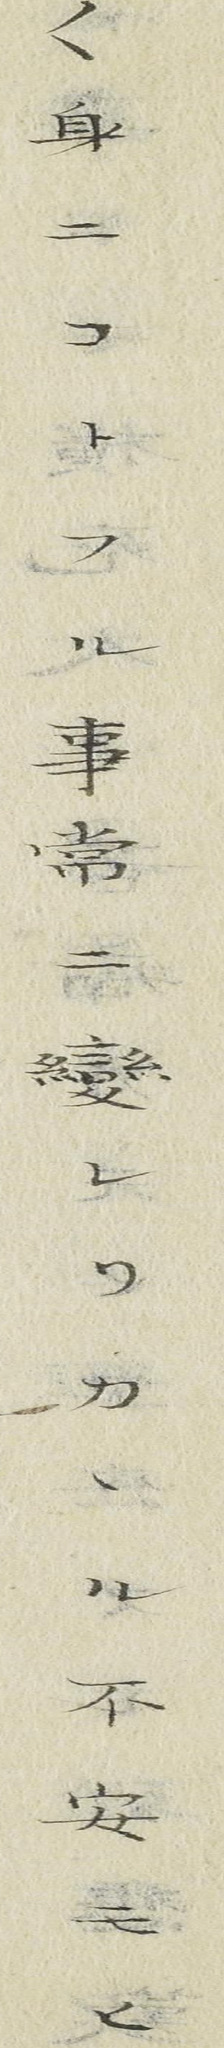〱身ニコトフル事常ニ変レリカヽル不安モヒ
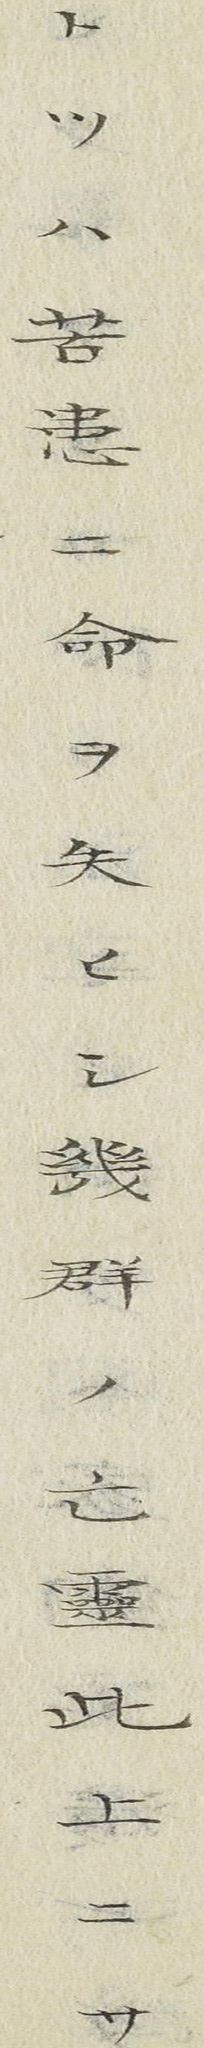トツハ苦患ニ命ヲ失ヒシ幾群ノ亡霊此上ニサ
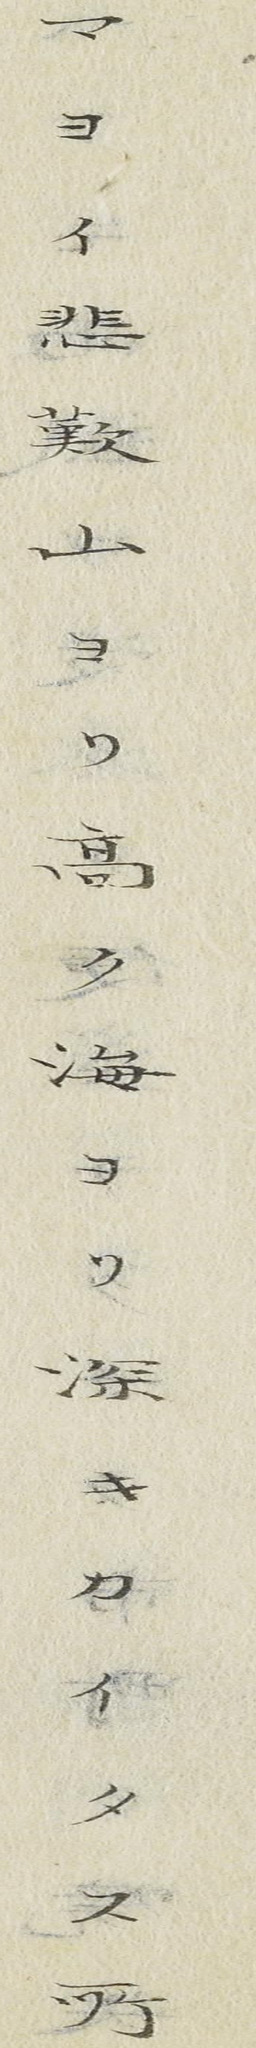マヨイ悲歎山ヨリ高ク海ヨリ深キカイタス所
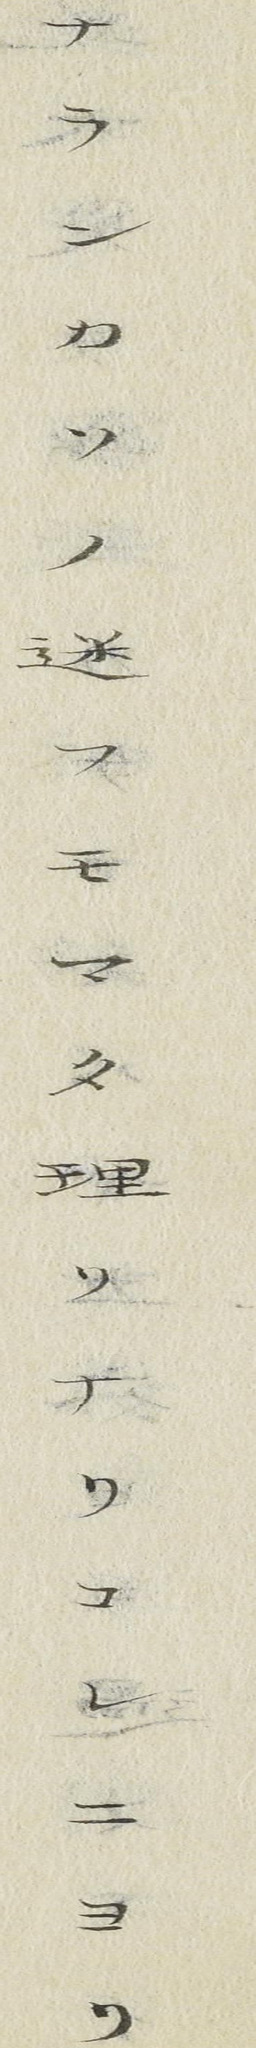ナランカソノ迷フモマタ理リナリコレニヨリ
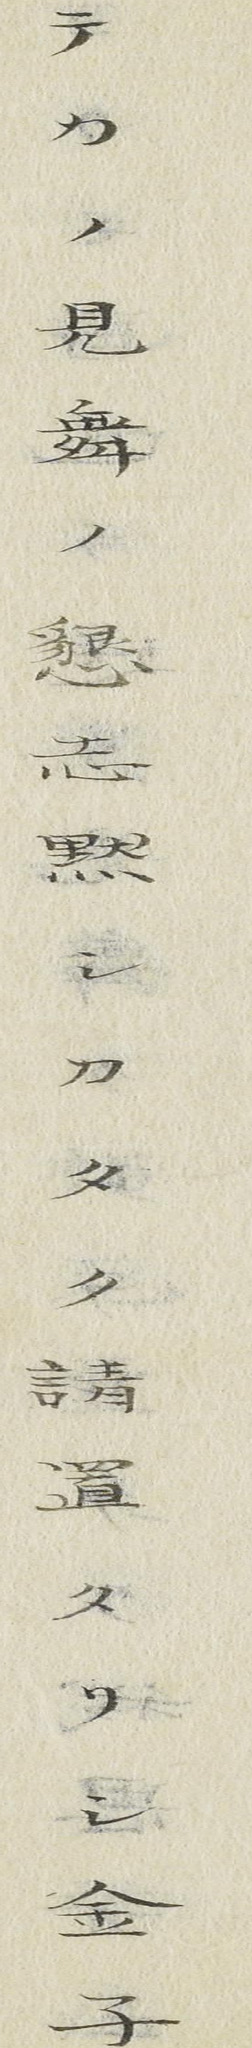テカノ見舞ノ懇志黙シカタク請置タリシ金子
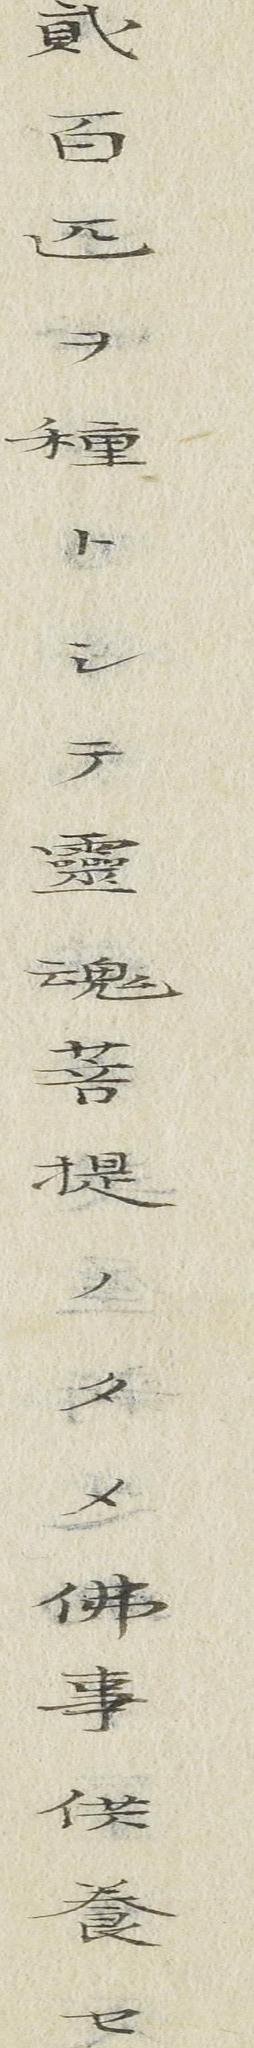弐百匹ヲ種トシテ霊魂菩提ノタメ仏事供養セ
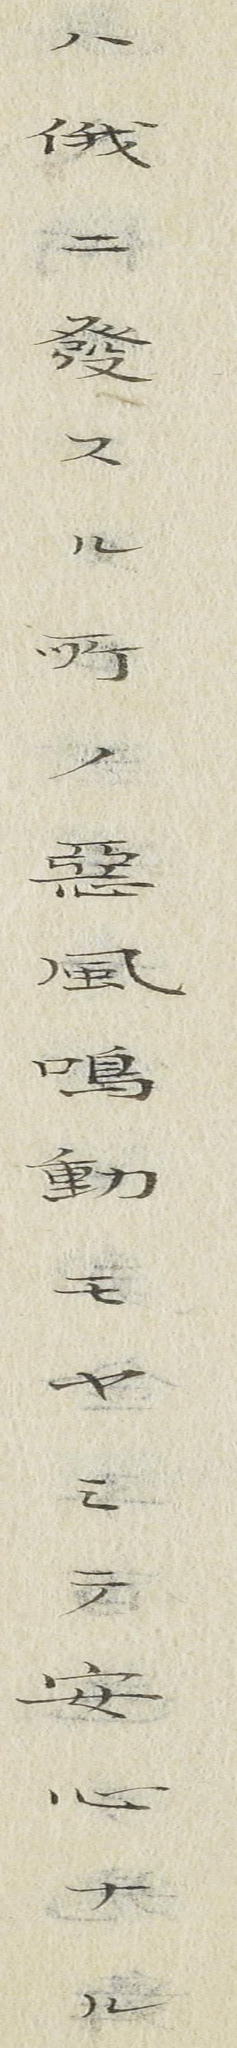ハ俄ニ発スル所ノ悪風鳴動モヤミテ安心ナル
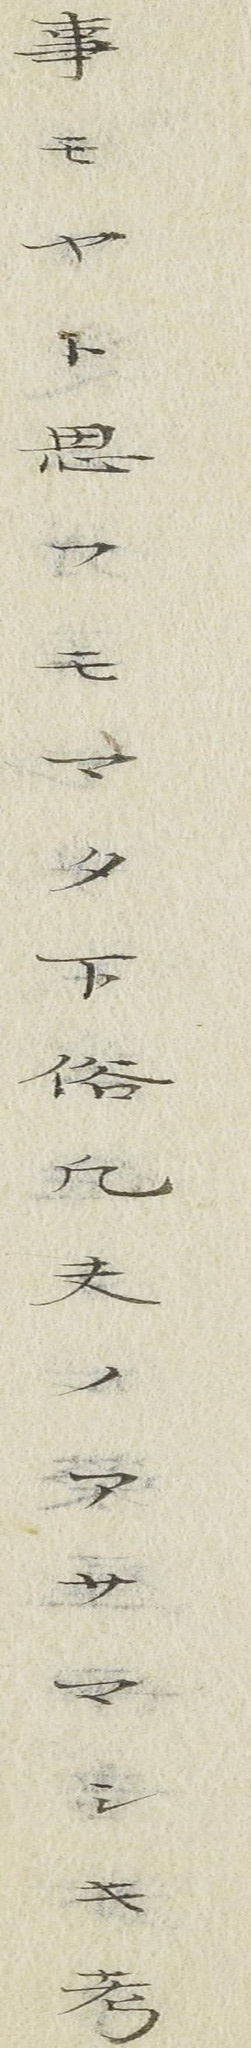事モヤト思フモマタ下俗凡夫ノアサマシキ考
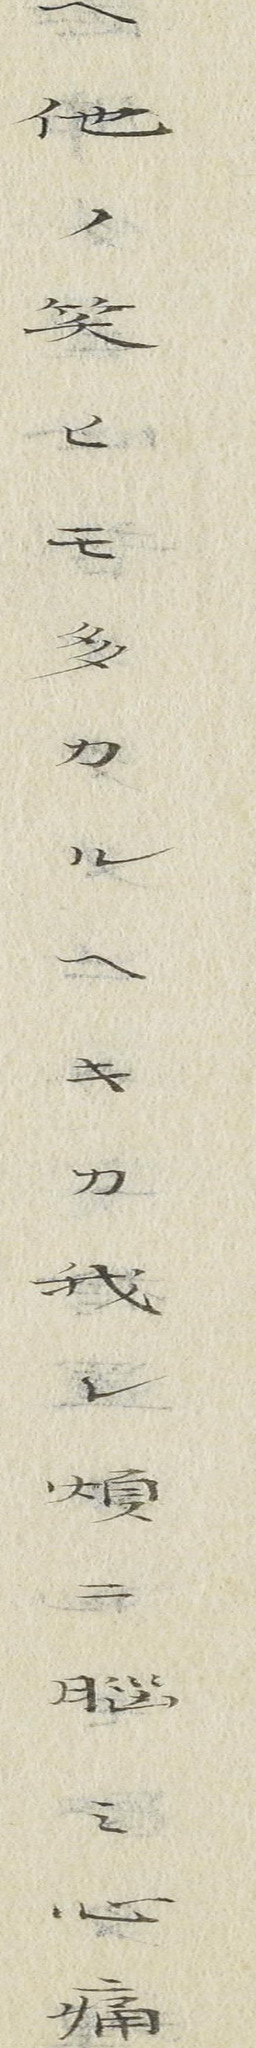ヘ他ノ笑ヒモ多カルヘキカ我レ煩ニ脳ミ心痛
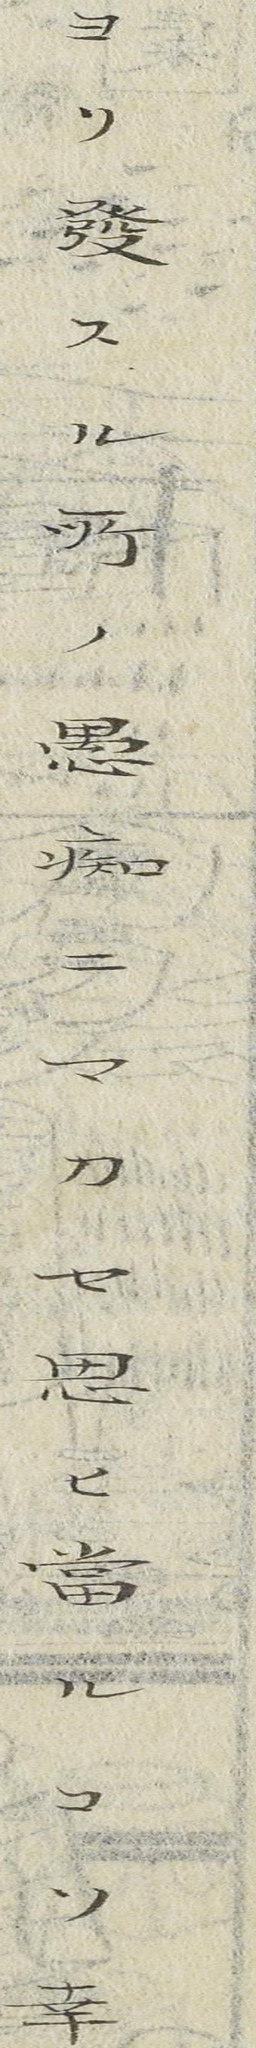ヨリ発スル所ノ愚痴ニマカセ思ヒ当ルコソ幸
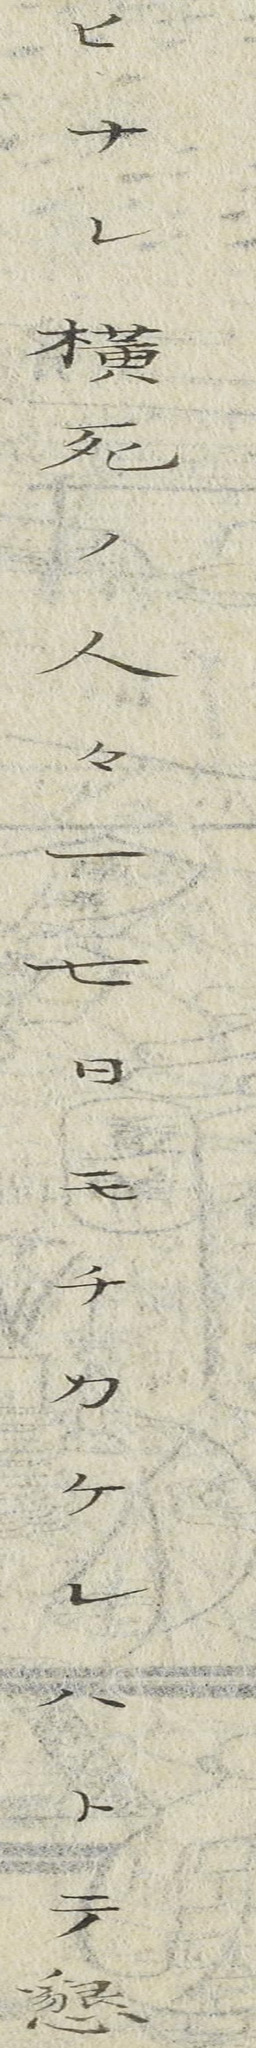ヒナレ横死ノ人々一七日モチカケレハトテ懇
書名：地災撮要　地震之部　巻ノ二
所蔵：東京大学地震研究所図書室 Earthquake Research Institute Library, The University of Tokyo, JAPAN
